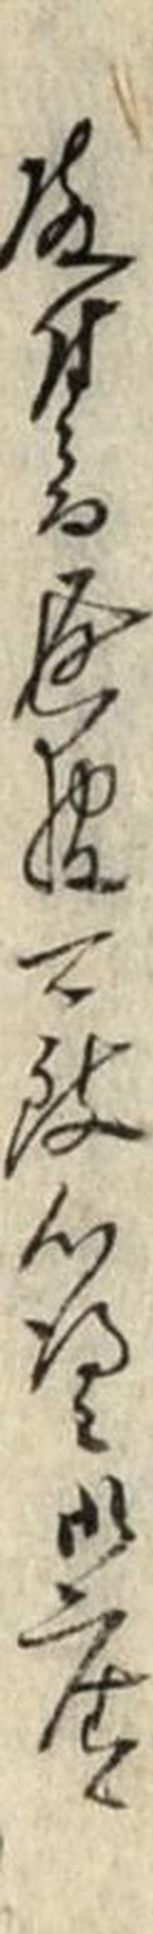殿付に而返報可致心得に御座候
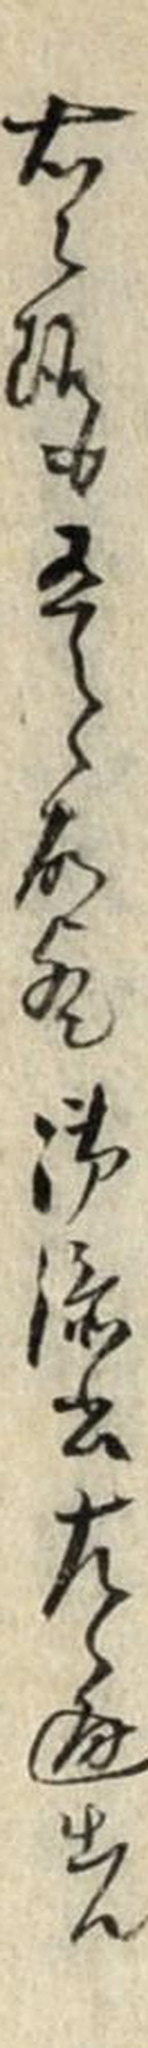右之趣も有之故歟御添書左之通出る
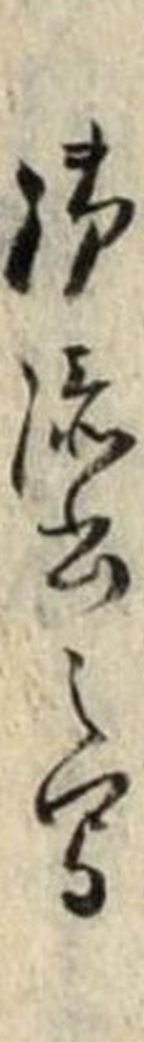御添書之写
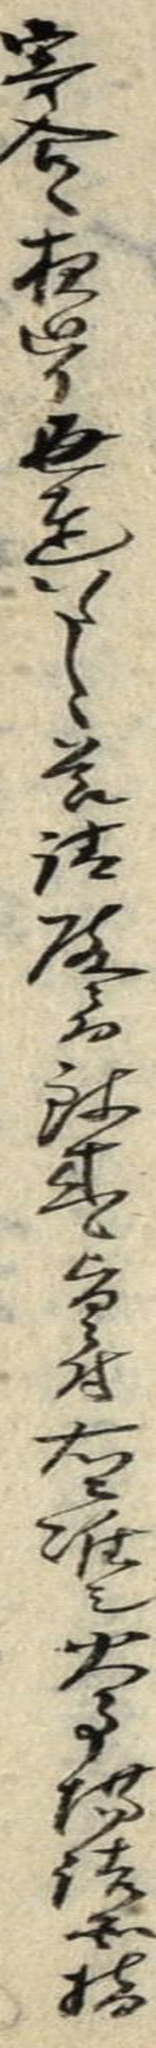寄合へ夜廻り通達いたし候節請殿に而致来候旨に付右に准し火事場詰所指
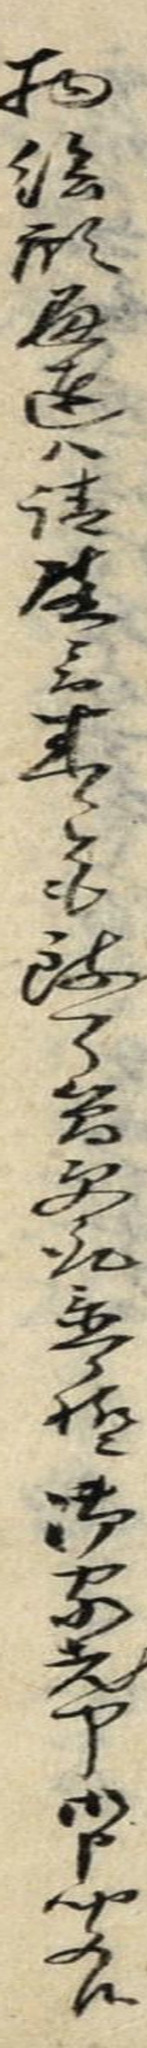物絵形通達は請殿に而来候とも致了簡受取置候様に御家老中御申聞候

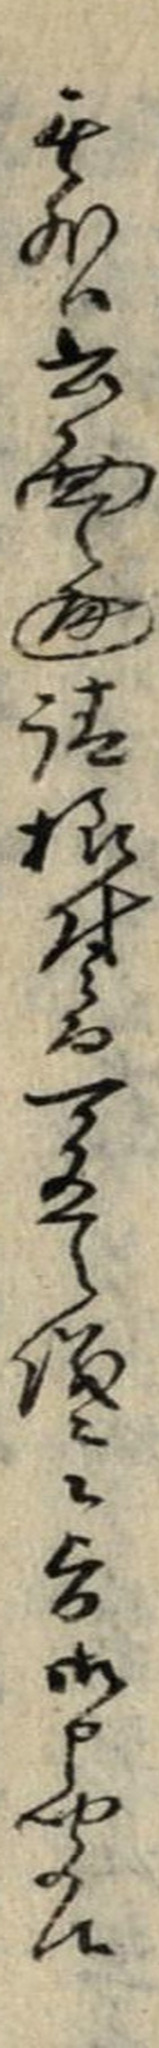其外は書面之通請様付に而可有之儀に候旨御申聞候
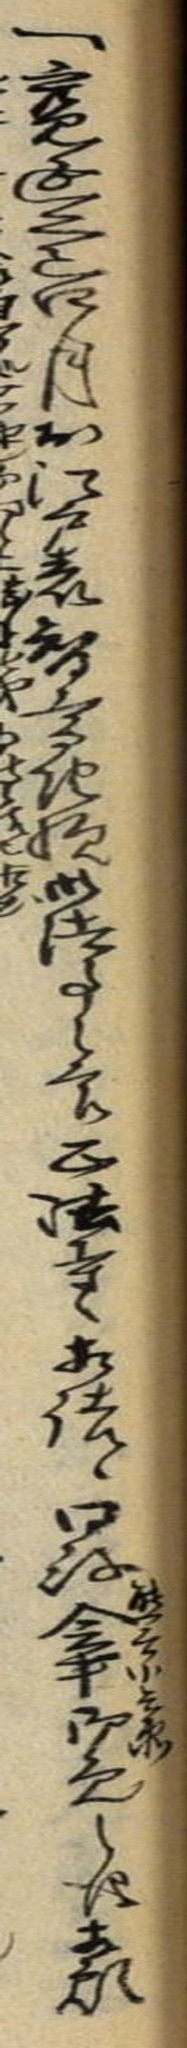一寛延二巳四月於江戸表智髙院様御法事之節正法寺へ相詰候同役熊谷小兵衛傘御免之儀相願
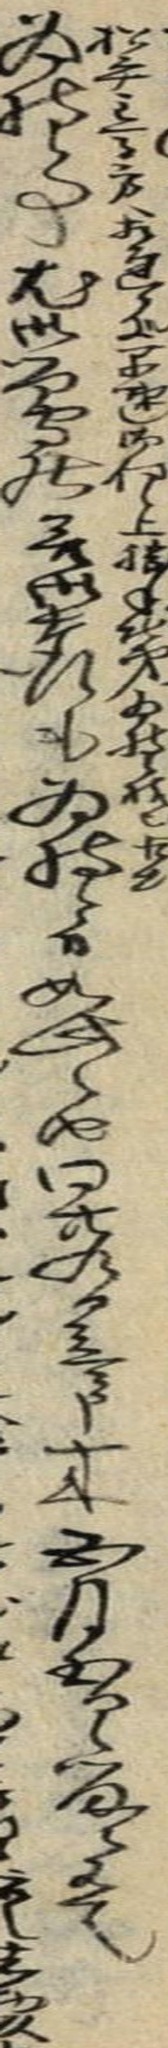為持候事尤御留守居并御奉行も為持候に付如此候由同廿九日立に申来五月五日之留に有之
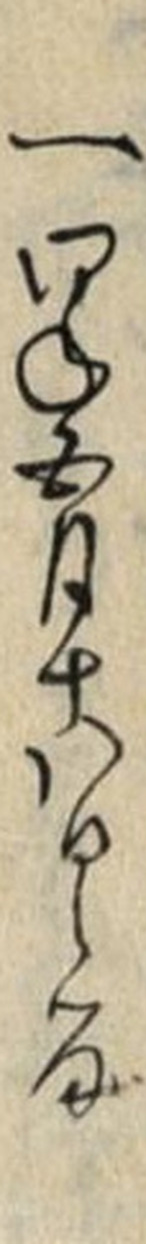一同年五月十八日之留
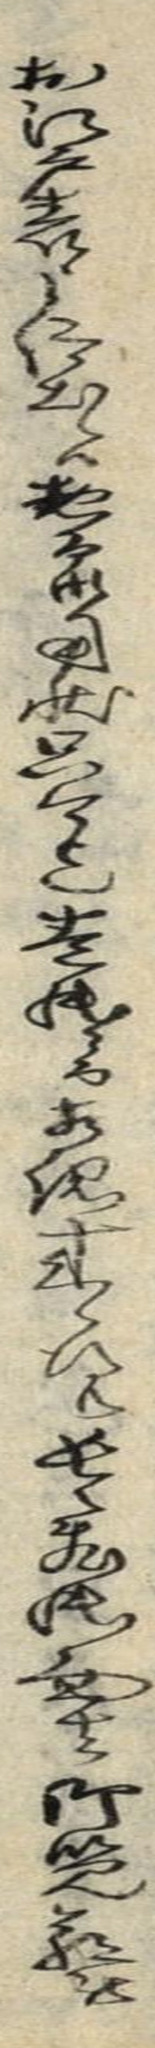於江戸表被仰出候は惣而御用状只今迄巻紙に而相認来候得共長々敷紙面は御覧難被
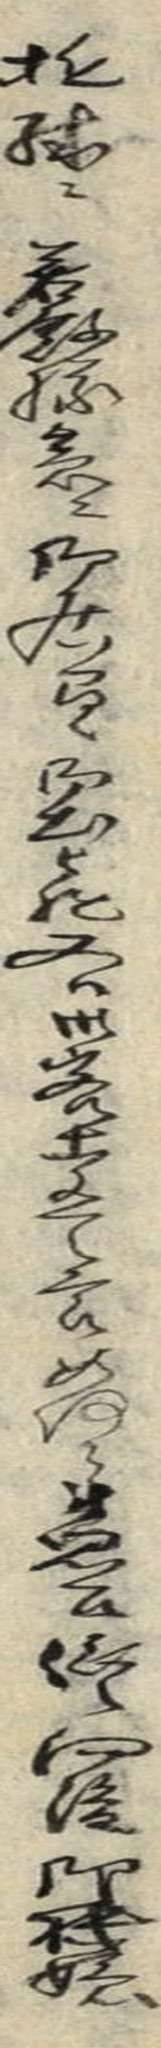遊殊に若殿様表之御居間へ御出被遊又は御客等有之節如何に被思召依之向後御機嫌
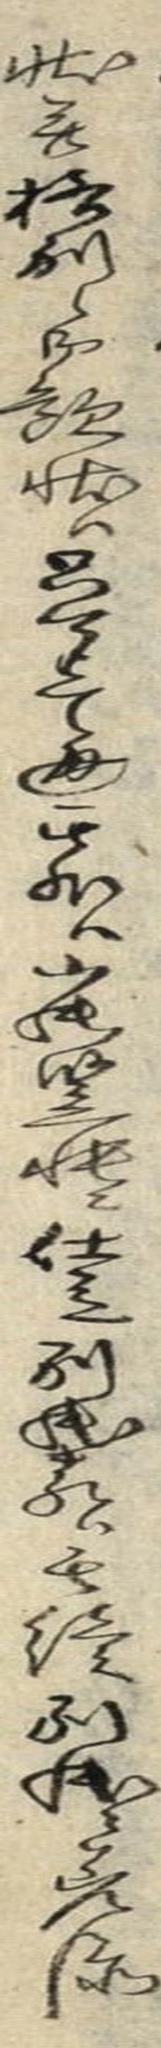状并格別之御歓状は只今迄之通其外は小紙堅帳に仕立別紙類は其続別紙に差添
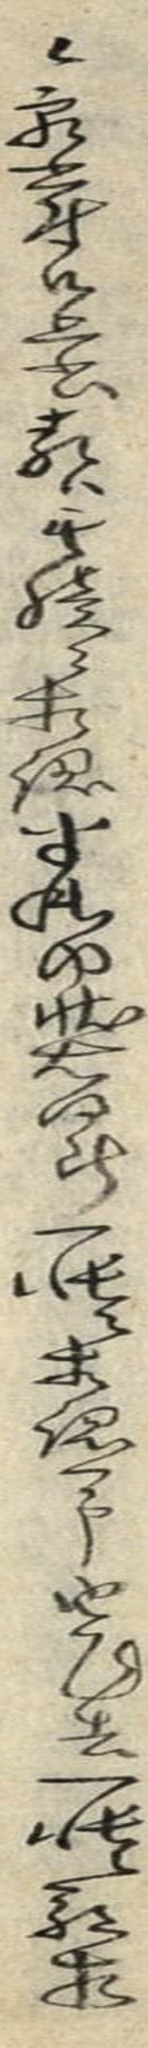而願書付口上書類は其続に相認半紙内状右同断一紙に相認可申由乍去一帳に難相
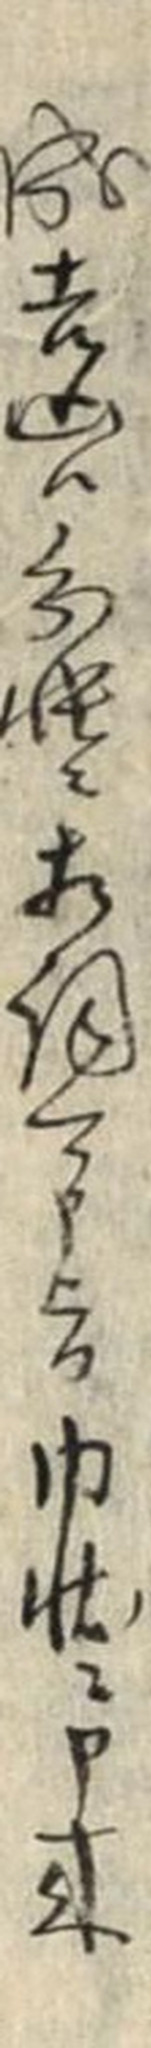成吉凶は分帳に相調可申旨内状に申来
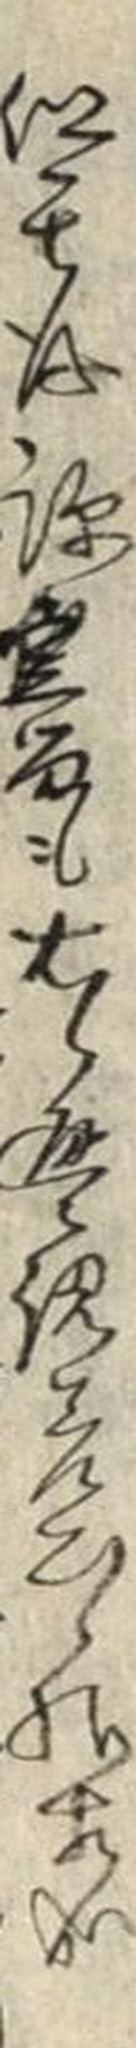但其後評定留も右之通に認差出候様相成
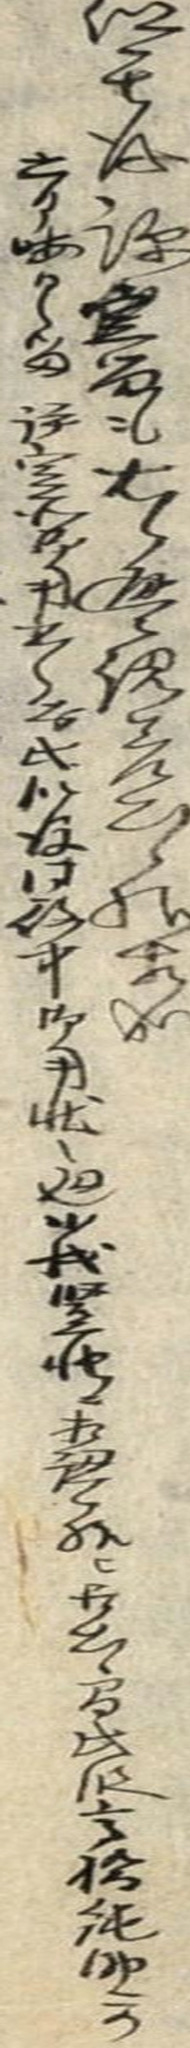六月晦日之留評定所御用書之義此以後同役中御用状之通小紙堅帳に相認候様被仰出候間此段高橋純助へ可
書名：蒐輯之部
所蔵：福井県文書館 Fukui Prefectural Archives
